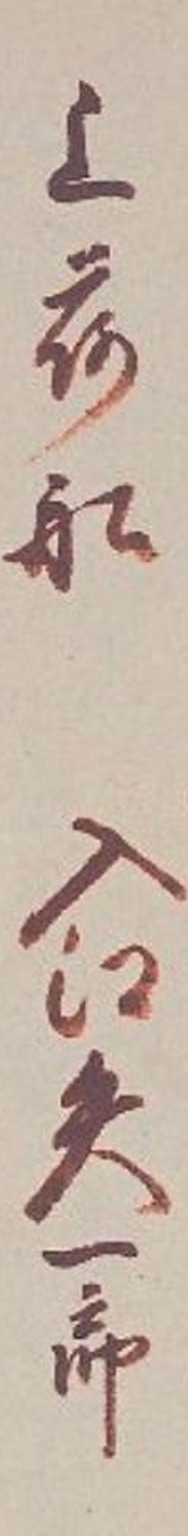上荷船入江矢一郎
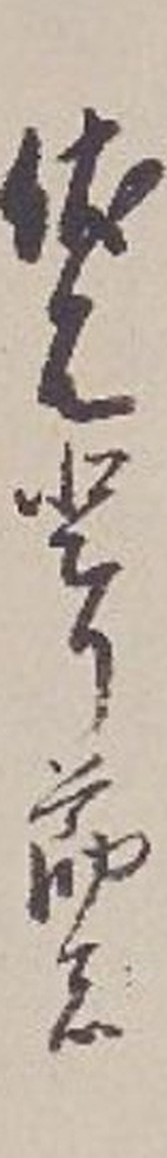伏見登り節は
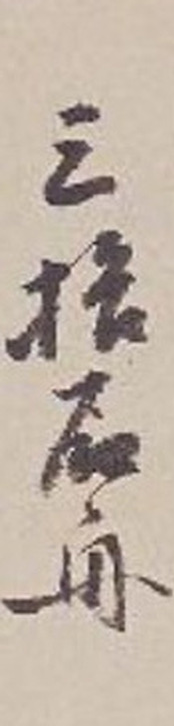三拾石舟

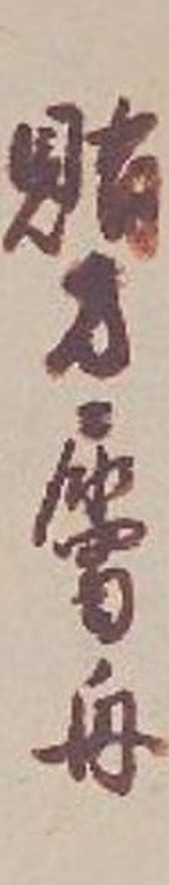賄方属舟
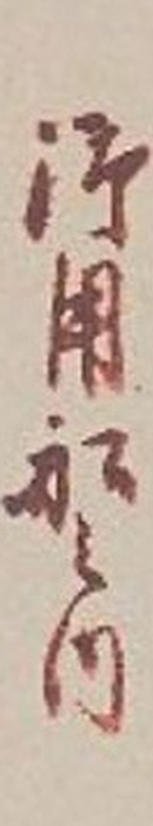御用船之内

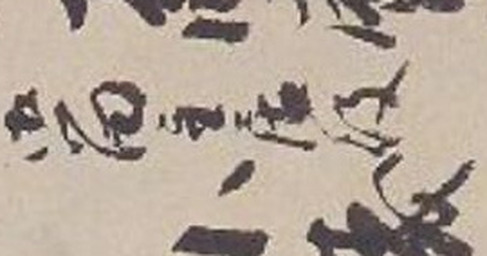御留守居役
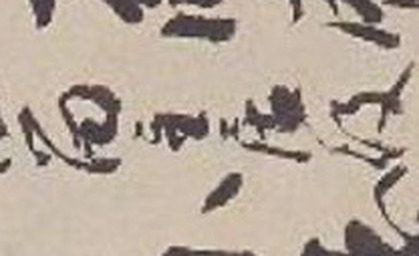御留守居役
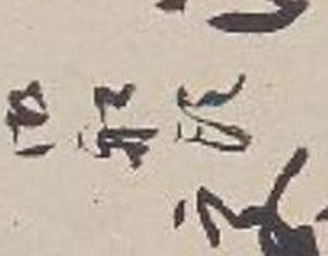御船頭

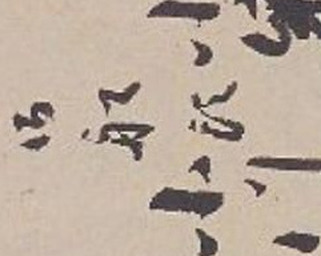御船頭
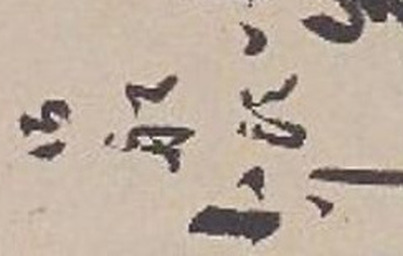御船頭
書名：琉球人就来府淀川筋船行列帳 但木津川より大阪御屋敷迄並其外一巻
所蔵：University of the Ryukyus Library
